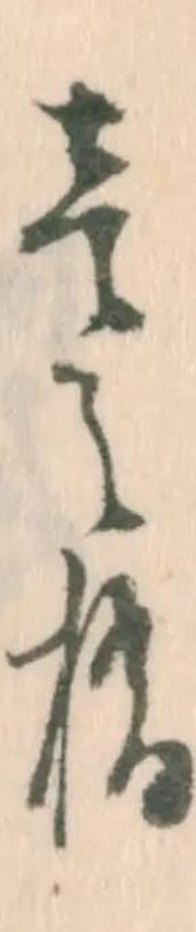壱之橋
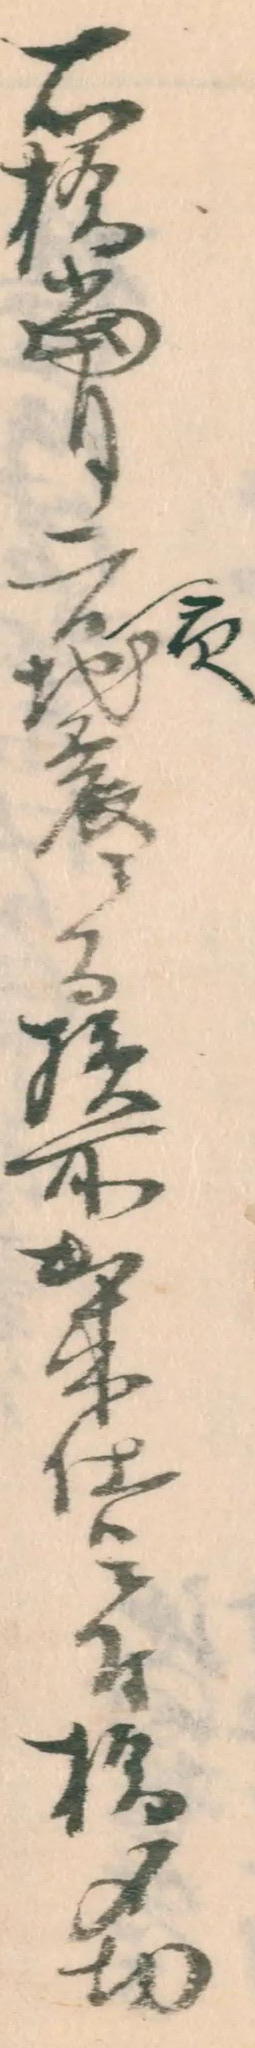右橋当月二日夜地震ニ而損所出来候ニ付橋〆切
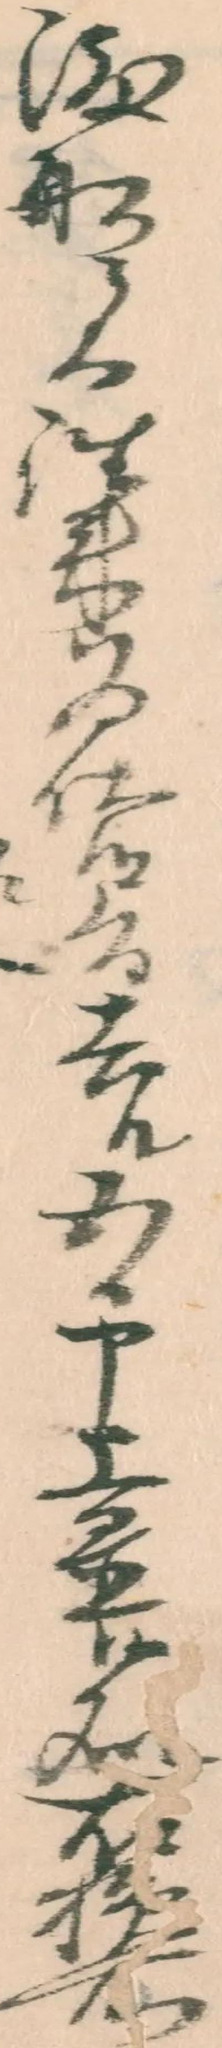渡船ニ而往来為仕候旨去ル五日申上置候処右損所
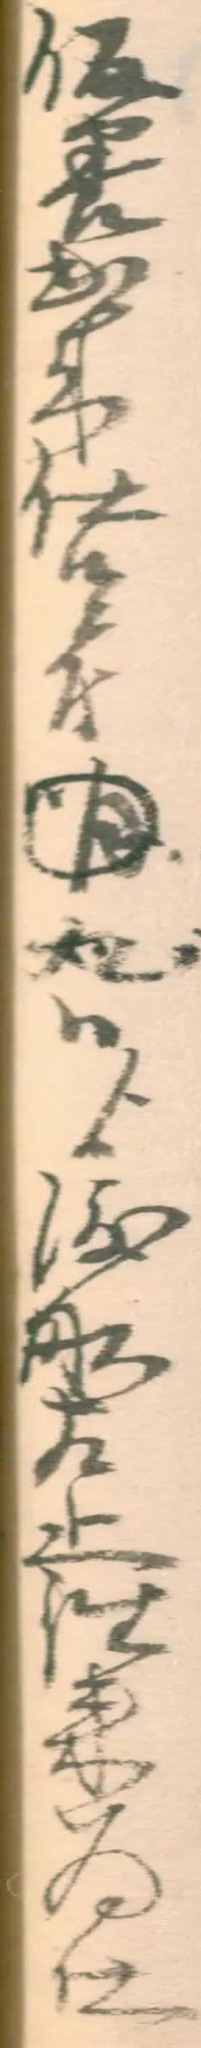仮養出来仕候ニ付明九日ゟ渡船相止往来為仕
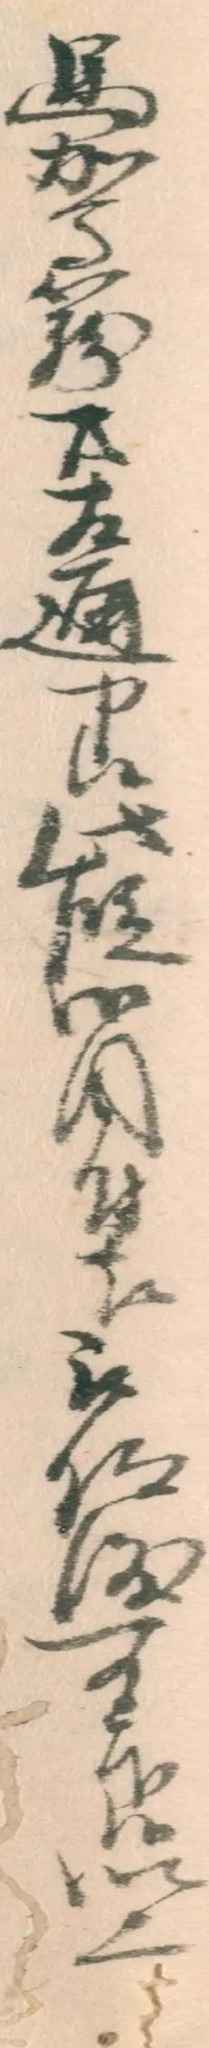馬駕籠共相通申候此段御目付え被仰渡可被下候以上
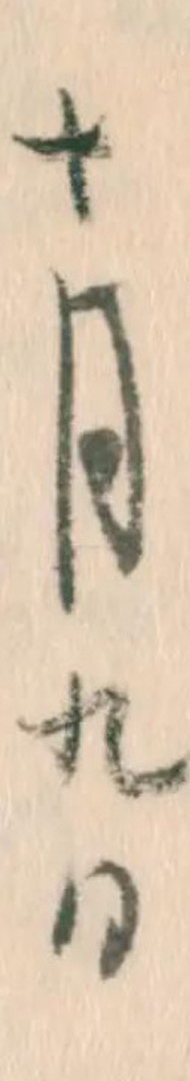十月九日
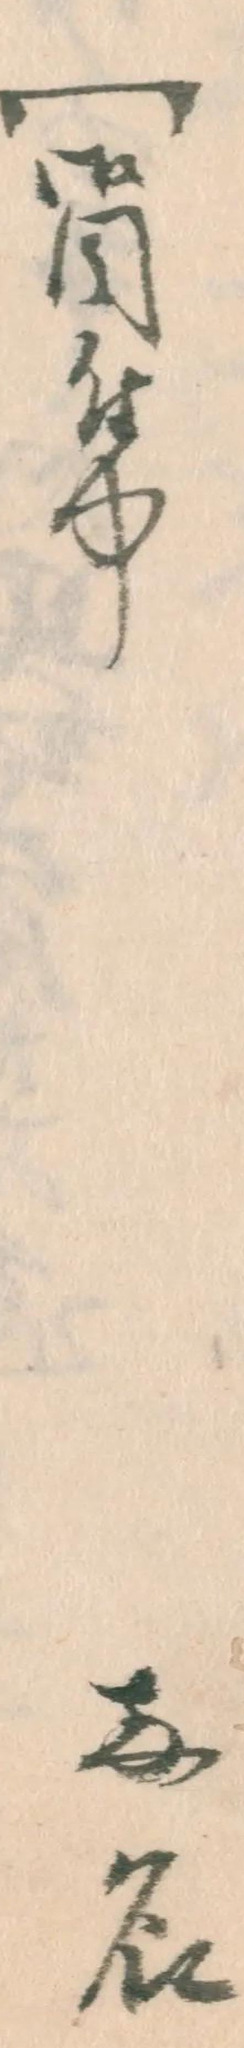[御目付中両名
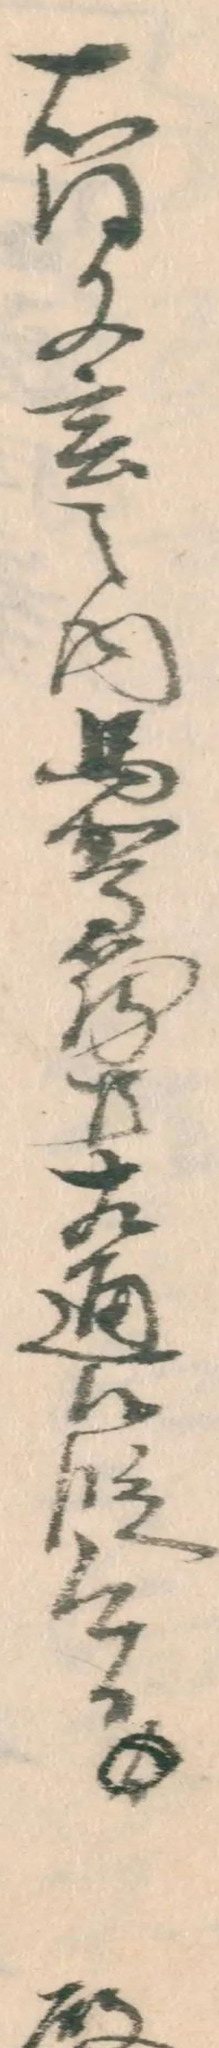右同文言之内馬駕籠共相通候段今日ゟ殿え
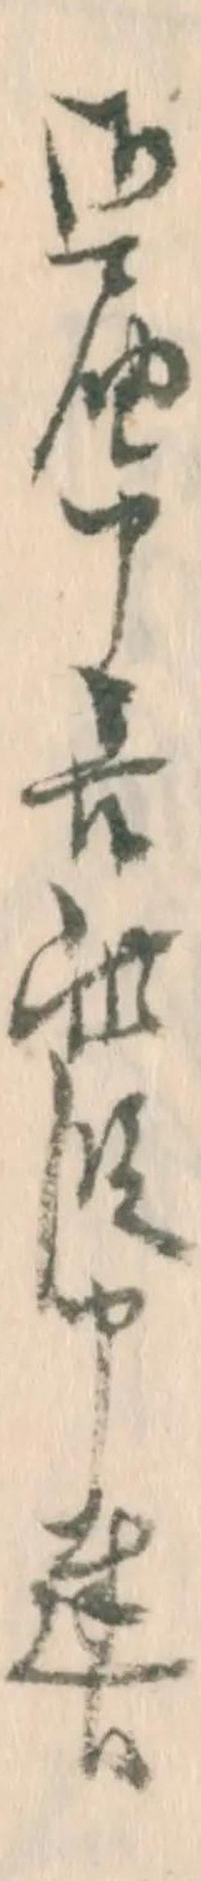御届申上候此段申達候
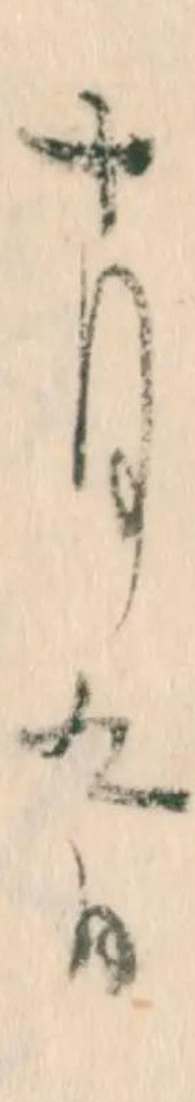十月九日

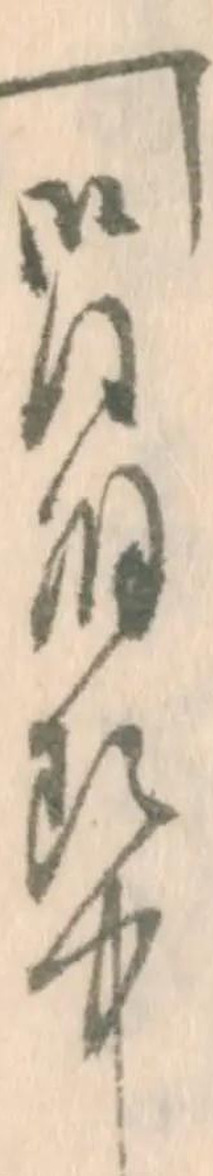[御同朋頭中
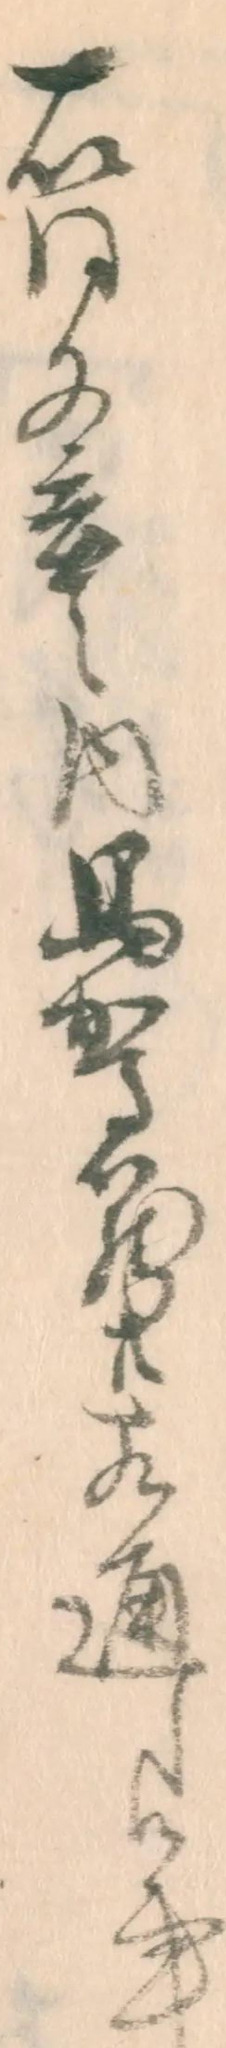右同文言之内馬駕籠共相通し候事
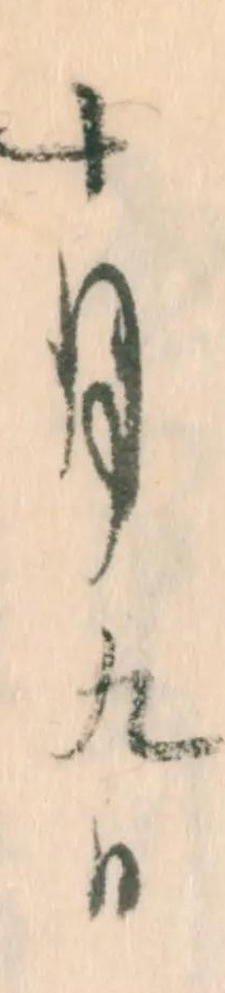十月九日
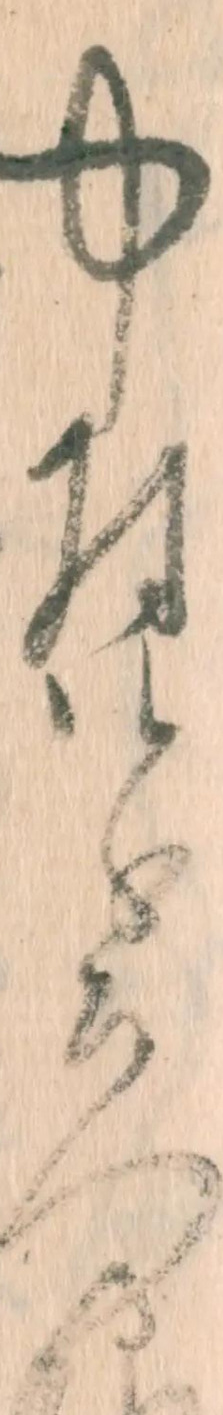中村八郎左衛門様
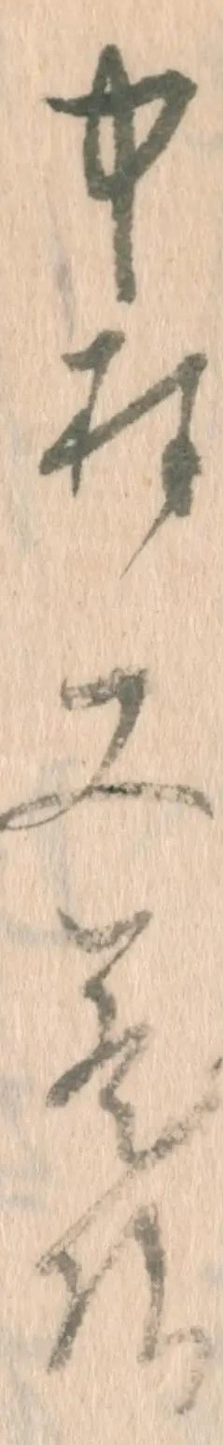中村又蔵様
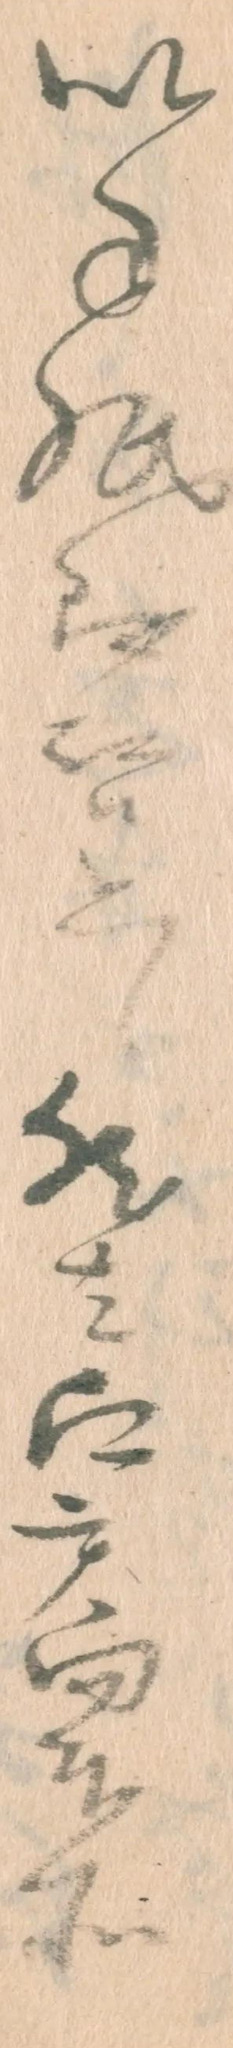以手紙致啓上候然者江戸向本所
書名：地震災書留 2巻. [1] 内表紙に「地震災書留　安政二卯年　但本所深川御用屋敷地代免除調」とあり
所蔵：国立国会図書館 National Diet Library, JAPAN
